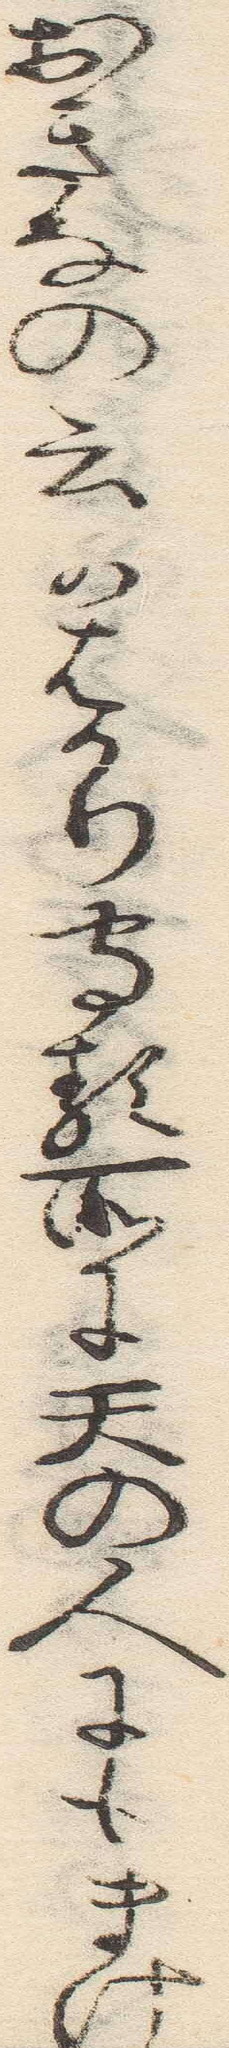おきなの云かはかり守る所に天の人にもまけ
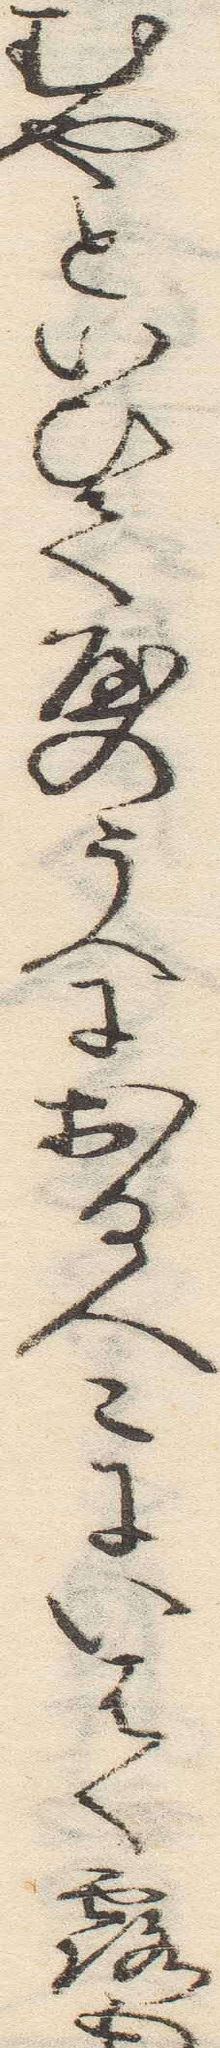むやといひて屋のうへにおる人々にいはく露も
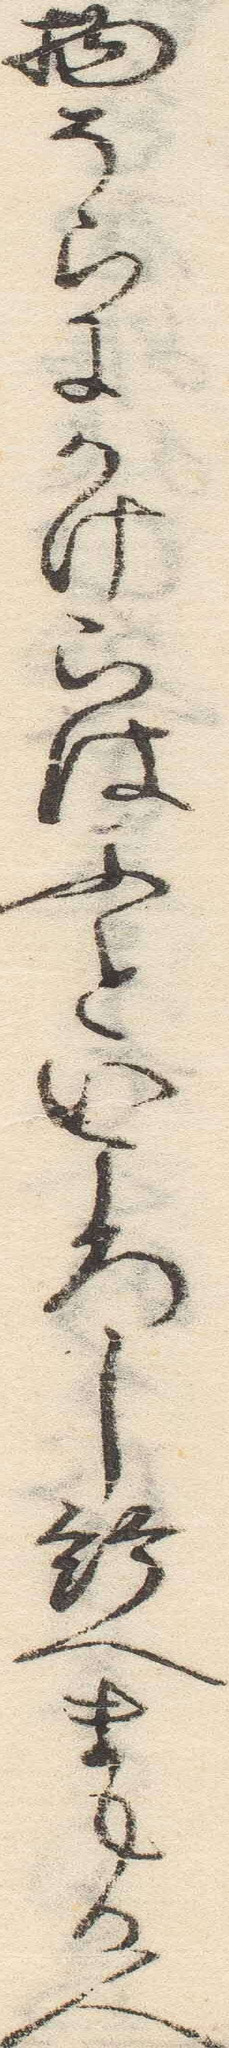物そらにかけらはふといころし給へまもり人
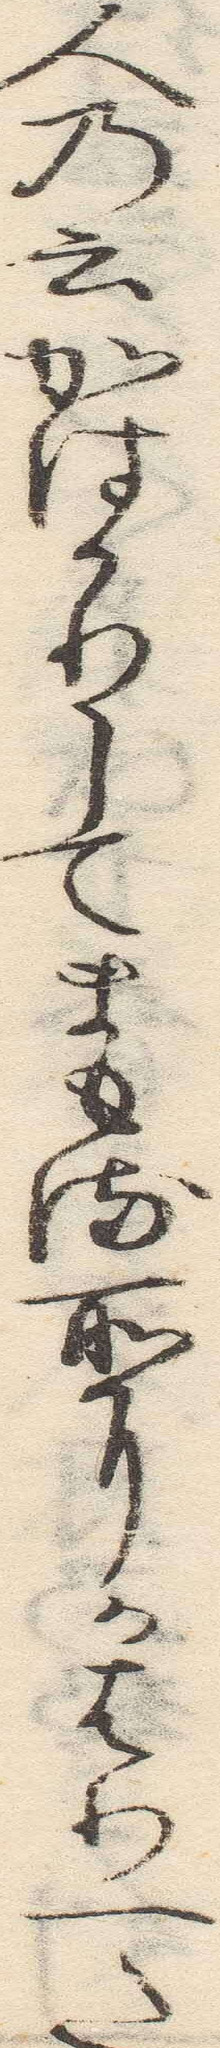人の云かはかりしてまもる所にかはり一た
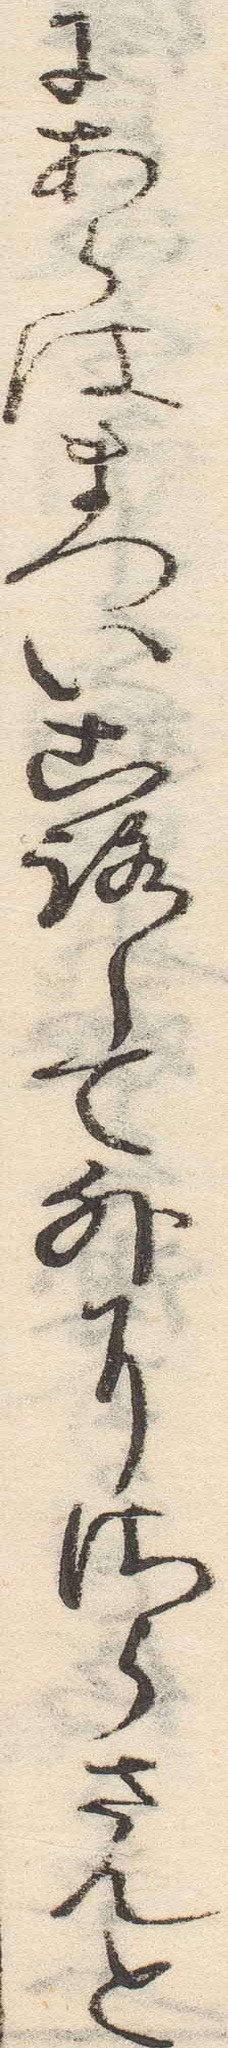にあらはまついころして外にさらさんと

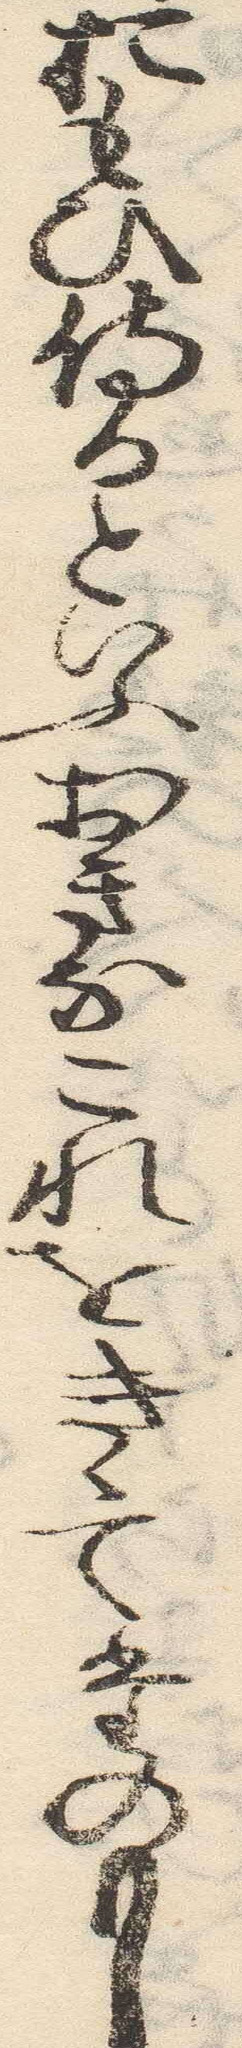おもひ侍るといふおきなこれをきゝてたのもし
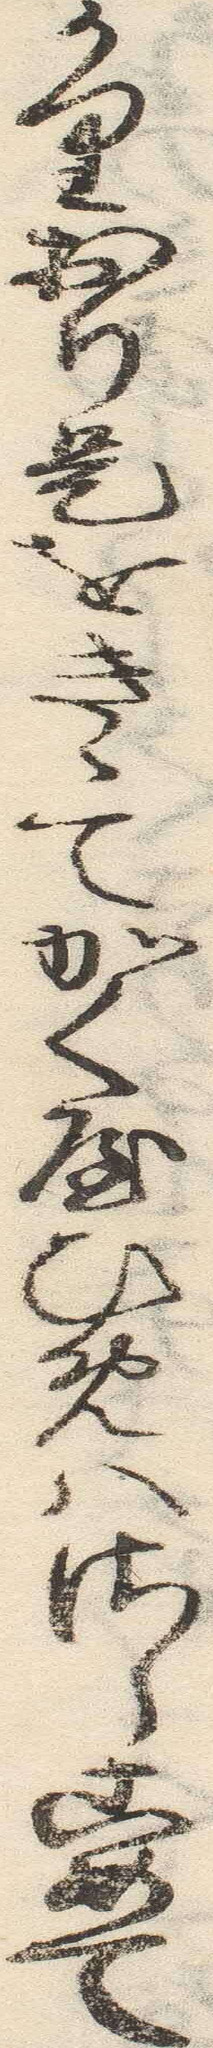かりおり是をきゝてかくやひめはさしこめて
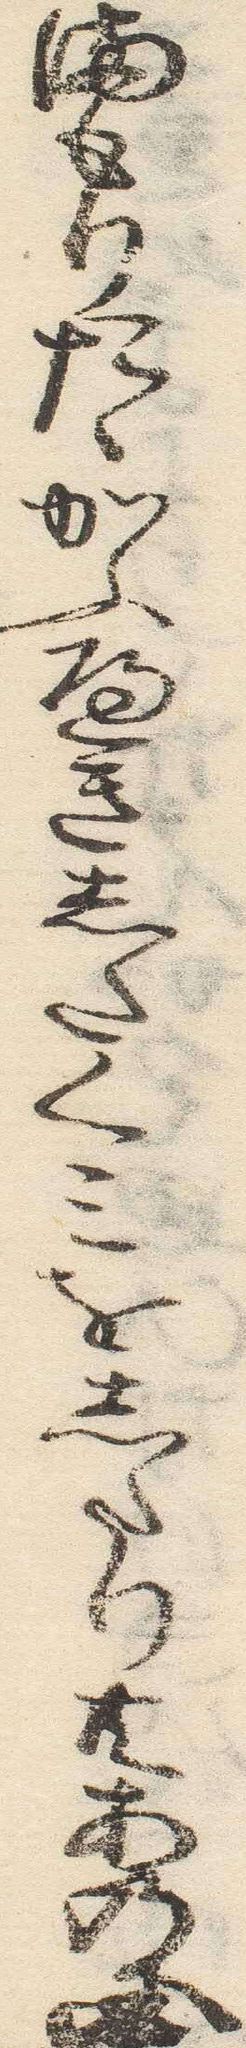まもりたゝかふへきしたくみをしたり共あの国
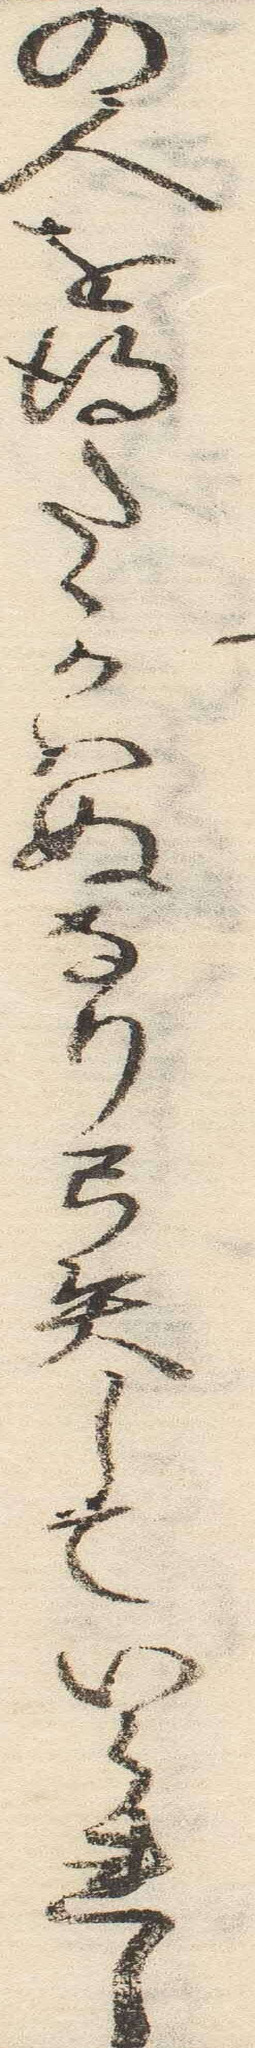の人を得たゝかはぬなり弓矢していられし
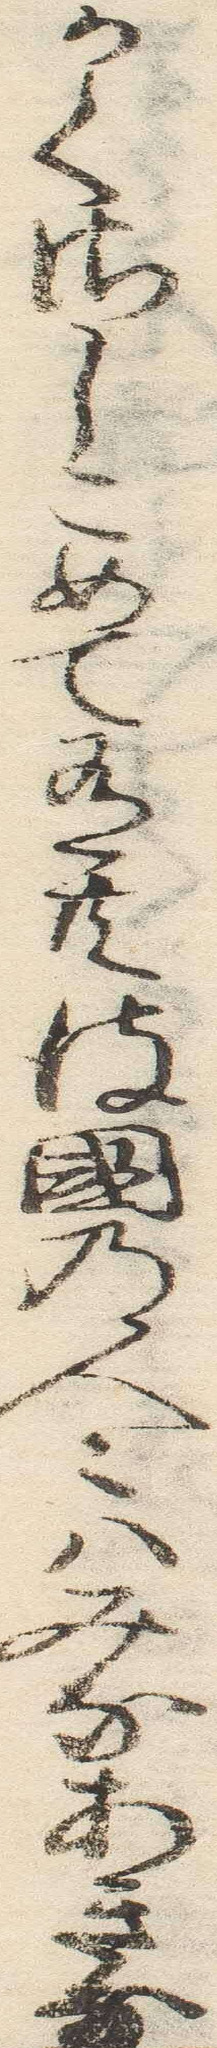かくさしこめて有共彼国の人々はみなあきな
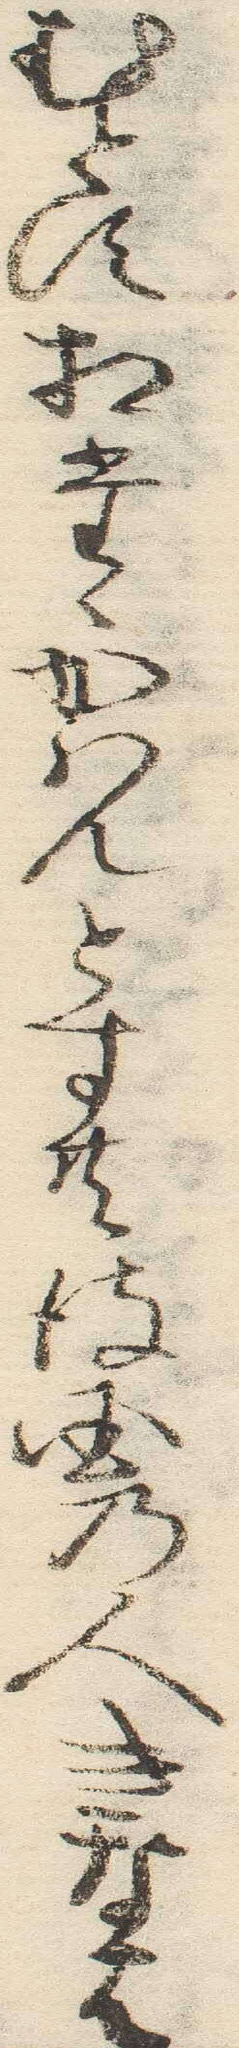むとす相たゝかはんとす共彼国の人きなは
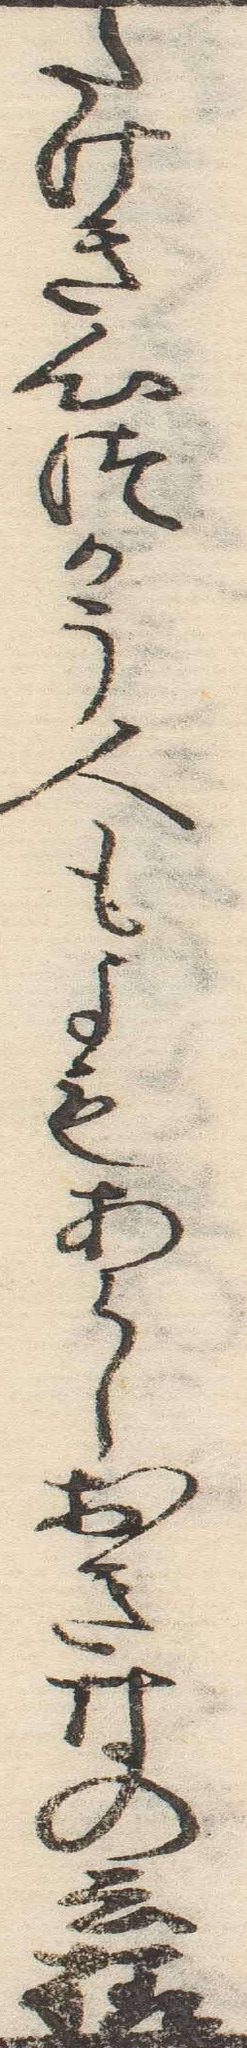たけき心つかう人もよもあらしおきなの云様
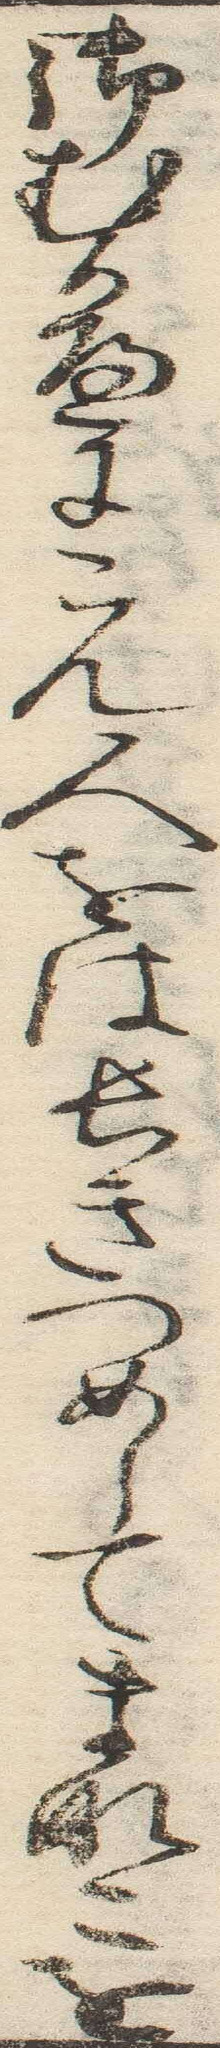御むかへにこん人をは長きつめしてまなこを
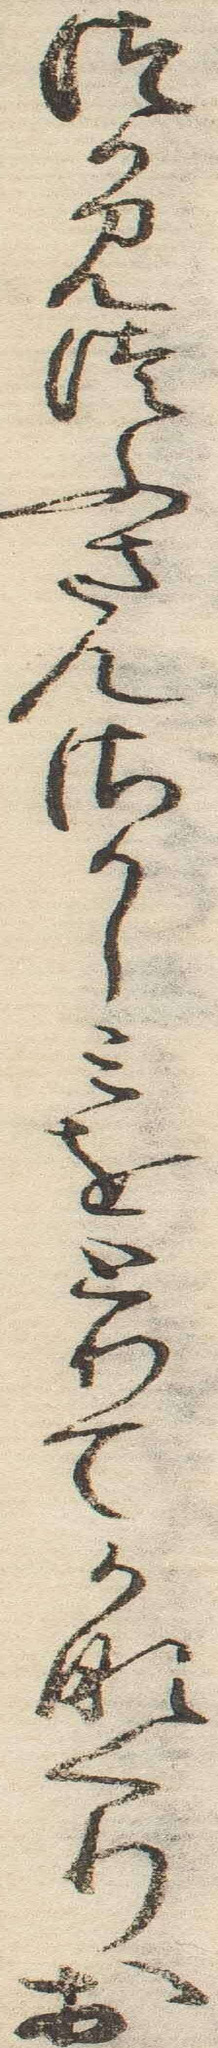つかみつふさんさかゝみをとりてかなくりお
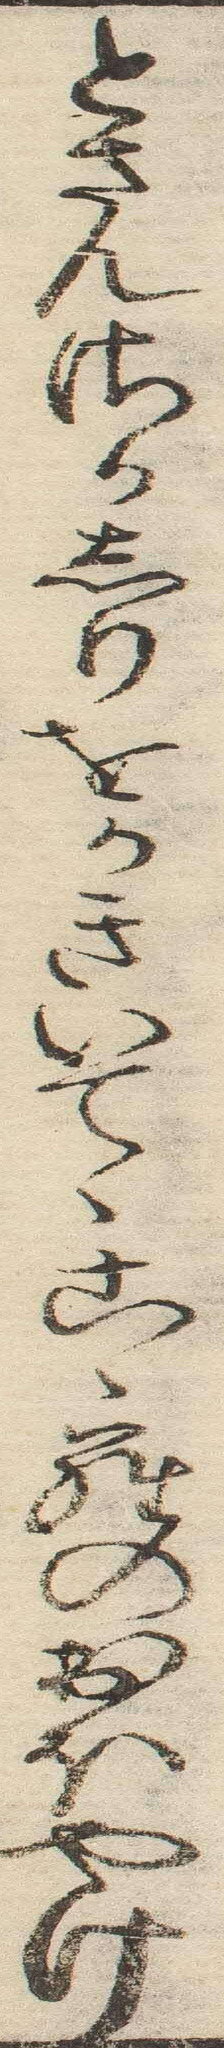とさんさかしりをかきいてゝこゝらのおほやけ
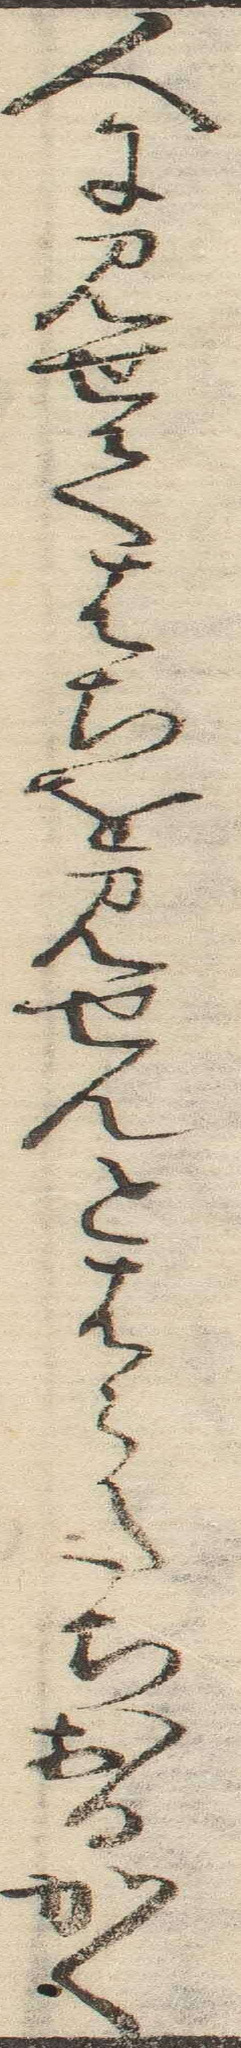人に見せてはちを見せんとはらたちおるかく
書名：竹取物語
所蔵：東京学芸大学附属図書館 国文学研究資料館
